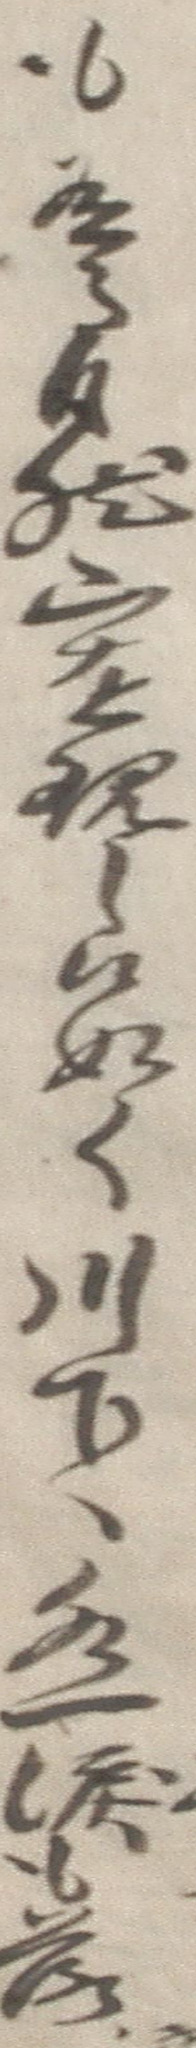も有之自然山を現し候如く川下へ水一涙も落
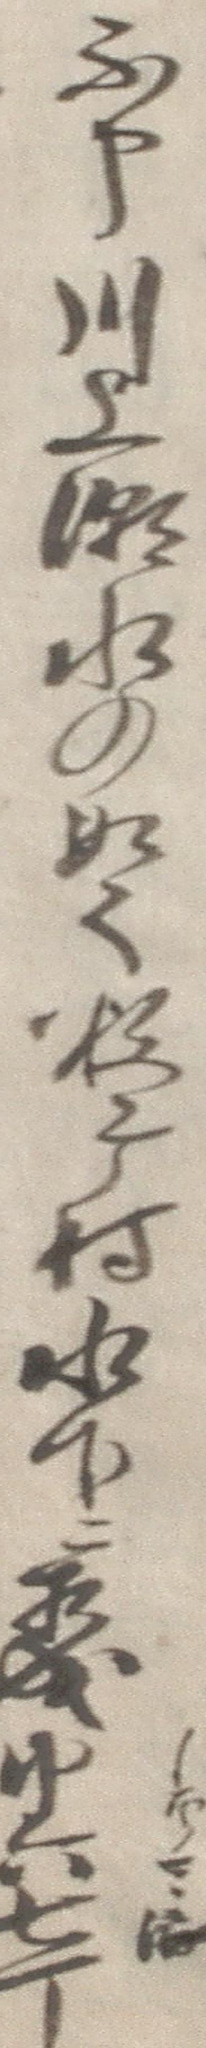不申川上激水の如く数ヶ村水下二相成巾六七丁
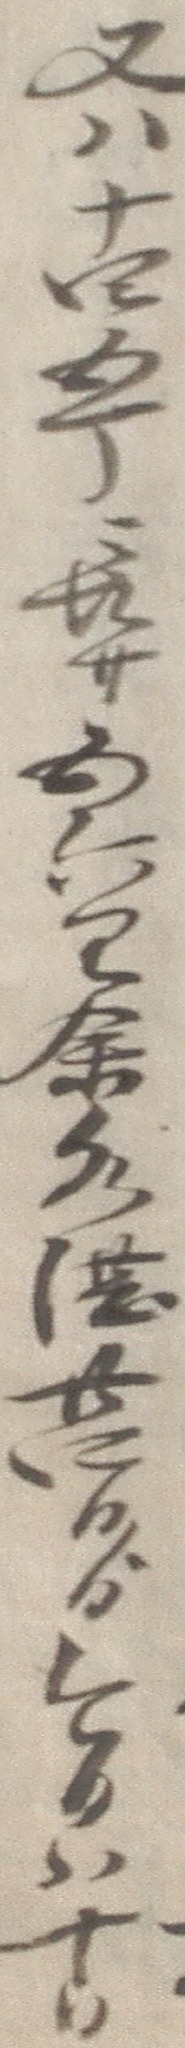又ハ十四五丁二長サ五六里余水湛廿四日ゟ今日ハ十日
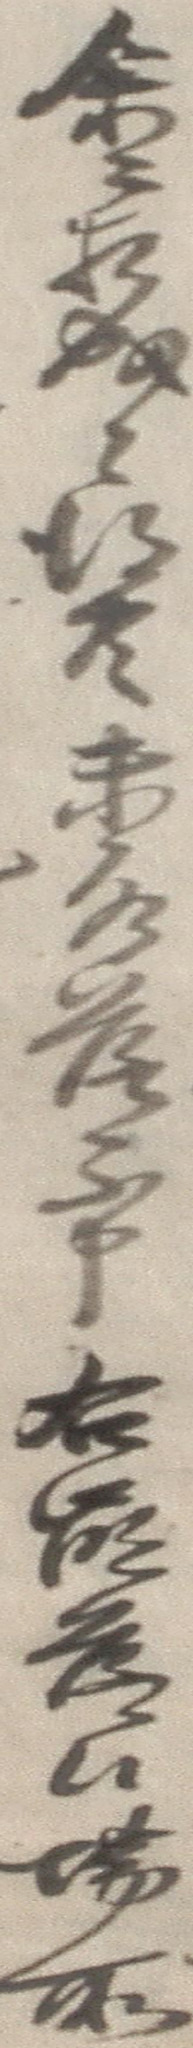余二相成候得共未水落不申右崩落候場所
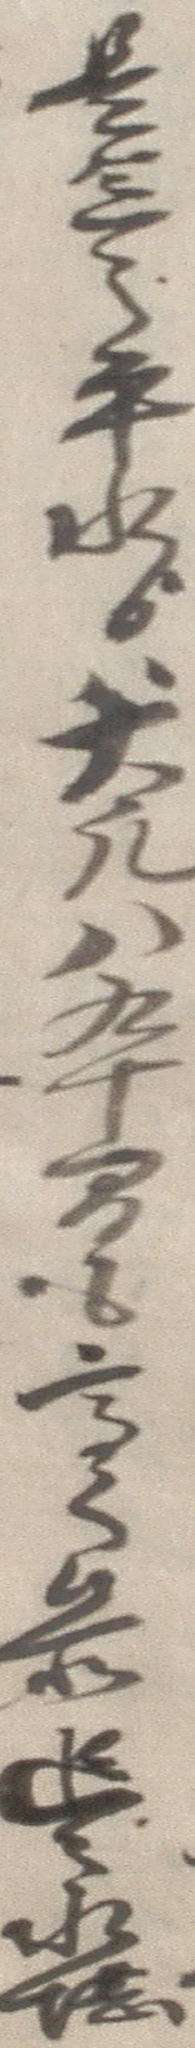是迄之平水ゟ大凡八九十間も高く候所追々水湛
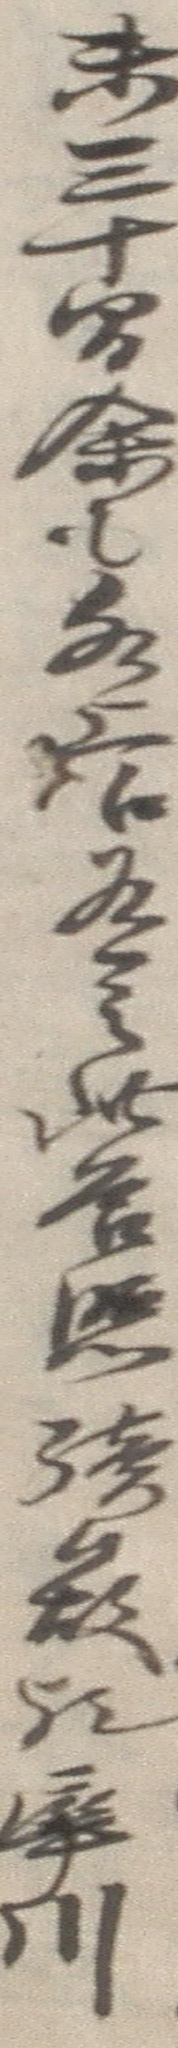未三十間余も水上江有之此節照強候故歟犀川
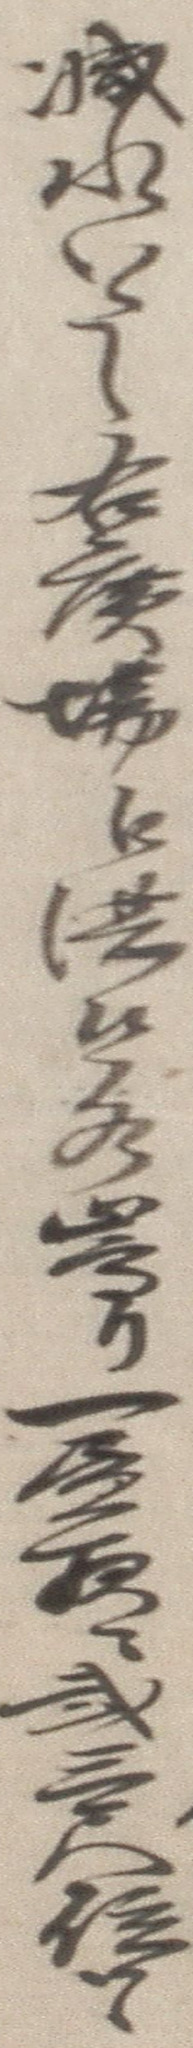減水いたし右広場江湛候水嵩り一昼夜二弐三尺位ツヽ
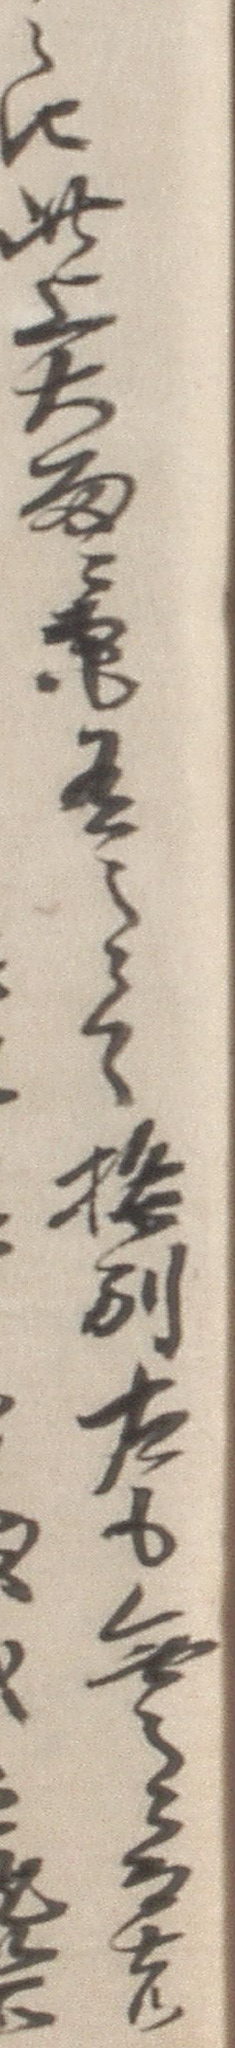之由此上大雨二而も有之候ハゝ格別左も無之候而は
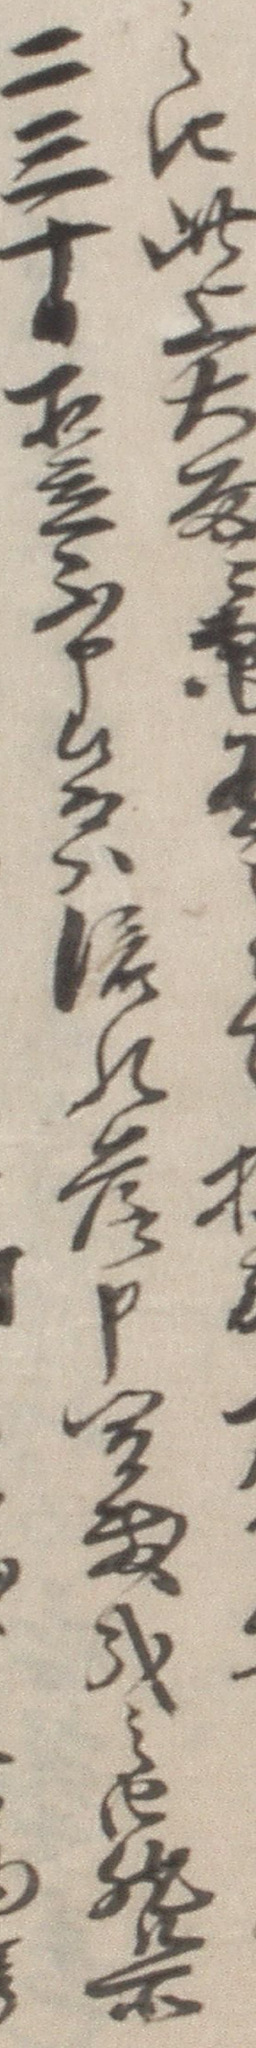二三十日相立不申不候而ハ流水落申間敷哉之由然ㇽ所
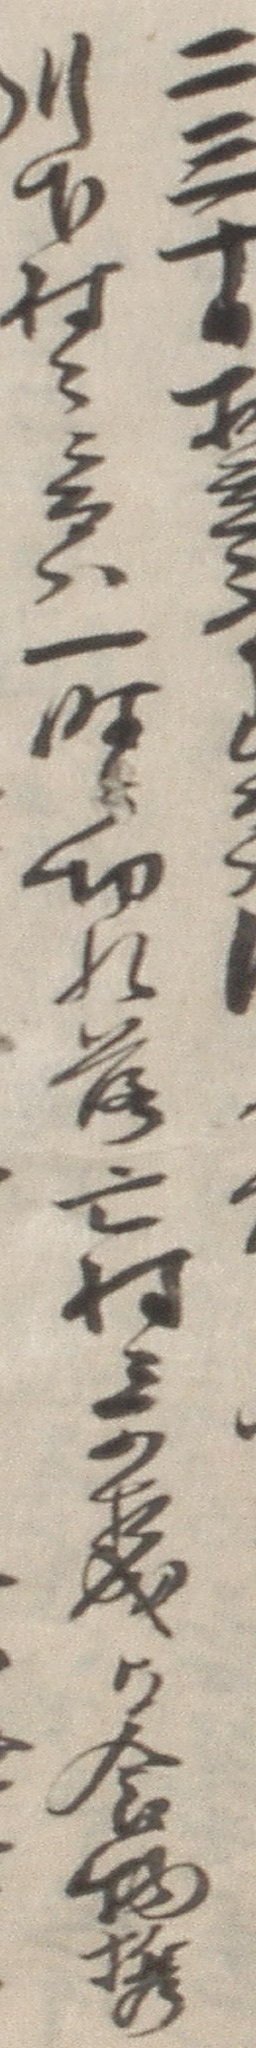川下村々二而ハ一時二切れ落亡村二可相成と食物携
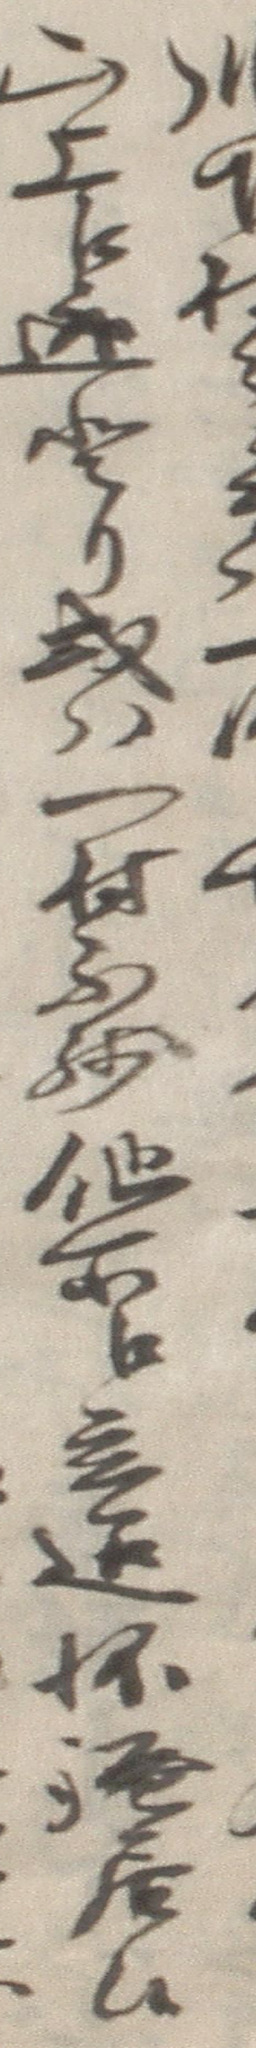山上江逃登り或ハ一村不残他所江立退抔騒居候
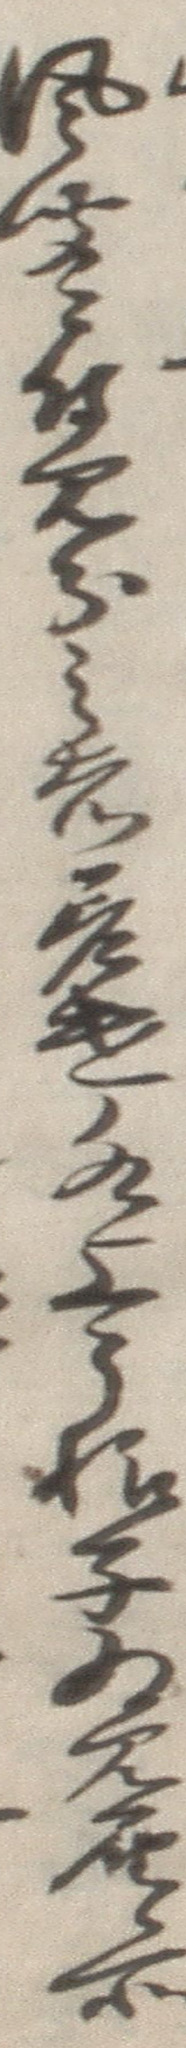風聞二付見分之者差遣水上之様子為見届候所
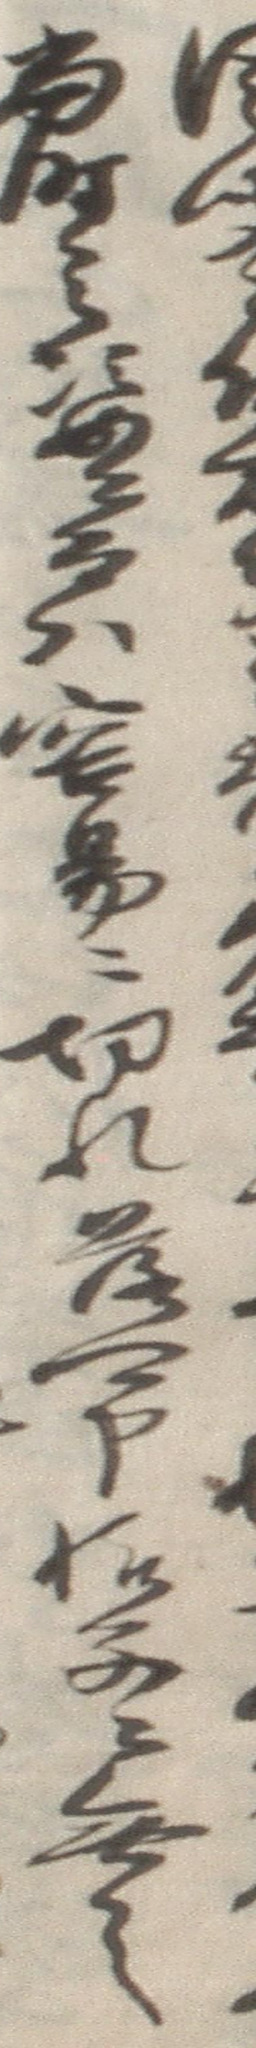当時之姿二而ハ容易二切れ落可申様子二無之
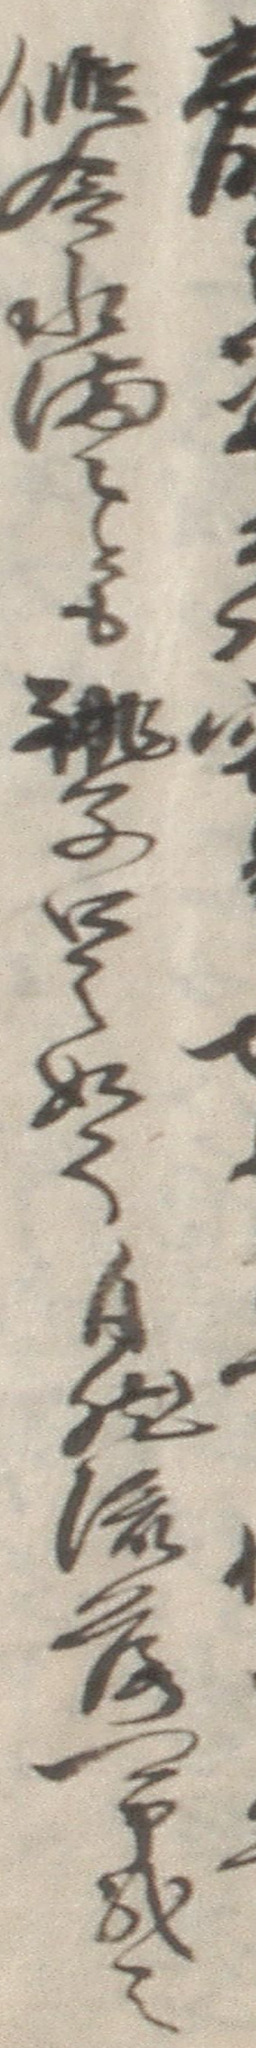縦令水満々とも銚子口之如く自然流落可申哉之
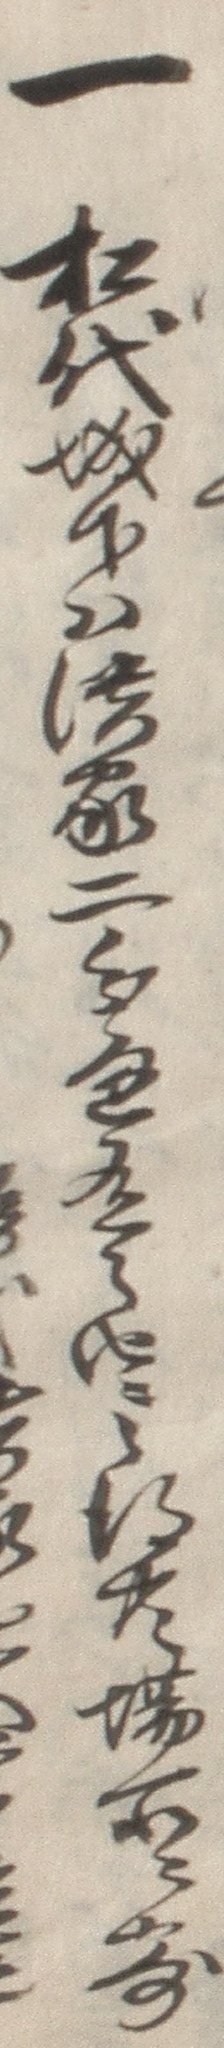一松代城下ハ潰家二分通有之由二候得共場所二寄
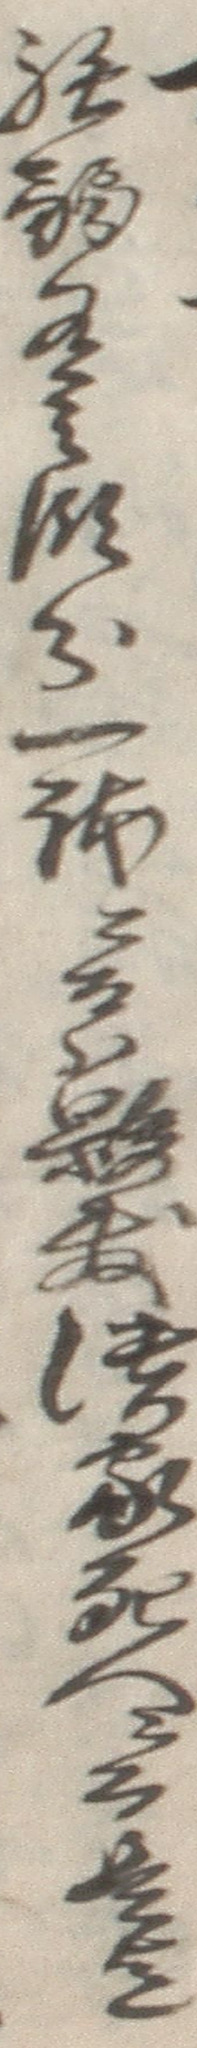強弱有之領分一躰二而ハ夥敷潰家死人二而是迄
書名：信州地震一件
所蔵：東京大学地震研究所図書室 Earthquake Research Institute Library, The University of Tokyo, JAPAN
